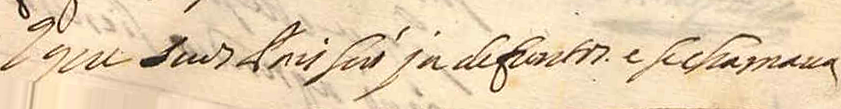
E que seus Pais saõ ja defuntos e se chamaua
